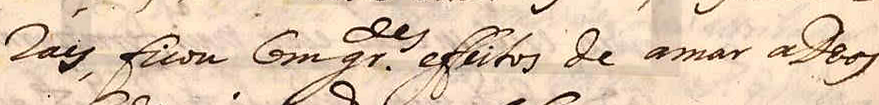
Raes, ficou Com g.des effeitos de amar a Deos
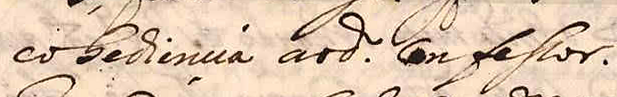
e obediencia ao d.o confessor.
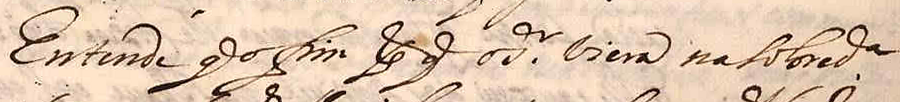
Entende q̄ o fim pa q̄ o s.or viera na sobred.a
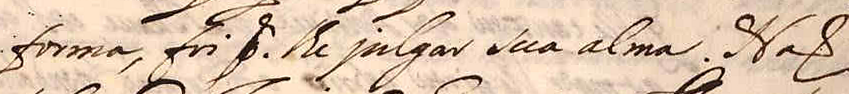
forma, foi p.a lhe julgar sua alma. Naõ
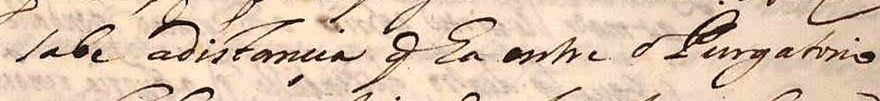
sabe a distancia q̄ ha entre o Purgatorio
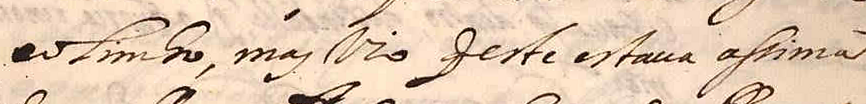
e o Limbo, mas Vio q̄ este estaua assima
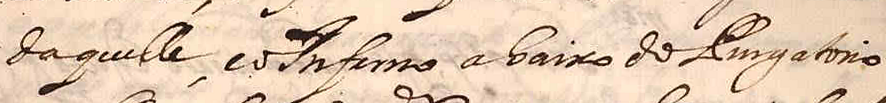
daquelle, e o Inferno abaixo do Purgatorio
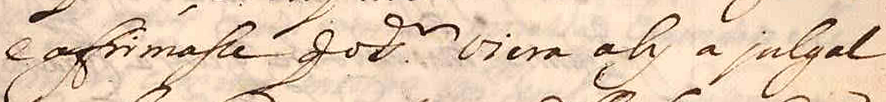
e affirmasse q̄ o s.or viera ahy a julgal
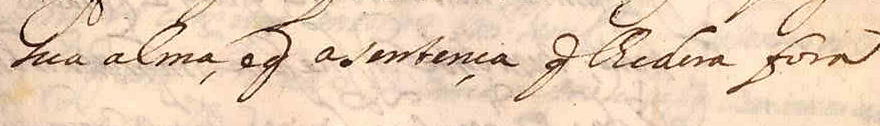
sua alma, e q̄ a sentença q̄ lhe dera fora
